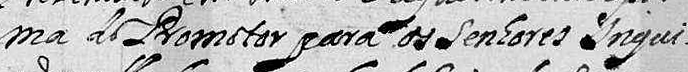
ma do Promotor para os Senhores Inqui
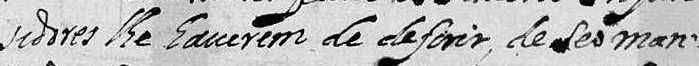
sidores lhe hauerem de deferir, de seo man
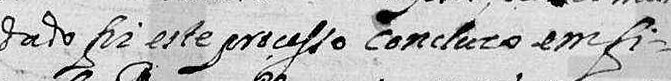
dado fiz este processo concluzo em fi
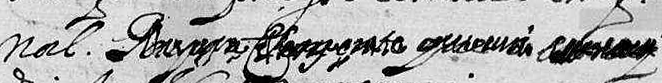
nal. Gaspar Clemente que_ o escreuj
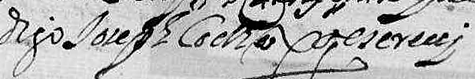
digo Iozeph Coelho o escreuj
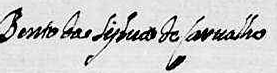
Bento da Silua de Carualho
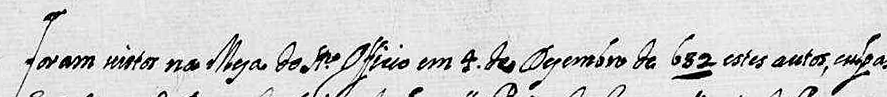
foram uistos na Mesa do St.o Officio em 4. de Desembro de 682 estes autos, culpas
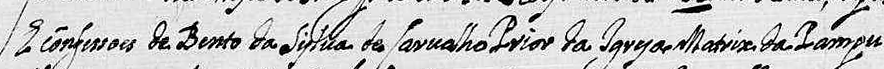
E cōnfissoes de Bento da Sylua de Carualho Prior da Igreja Matrix da Pampu
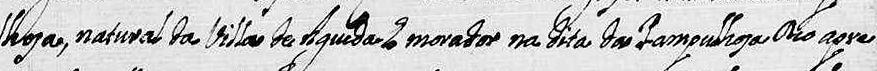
lhosa, natural da Villa de Agueda E morador na dita da Pampulhosa Reo apre
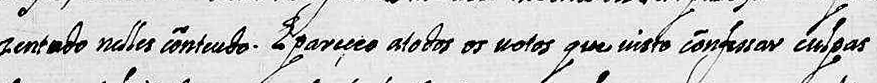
zentado nelles cōnteudo. E pareceo a todos os uotos que uisto cōnfessar culpas
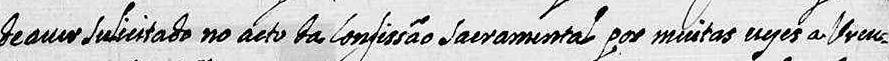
de auer sulicitado no acto da Confissão Sacramental por muitas ueses a Vrçu
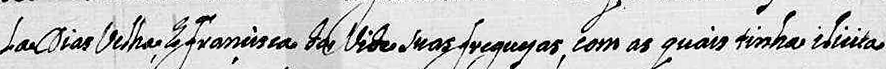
la Dias Velha, E Francisca da Vide suas freguesas, com as quais tinha ilicita
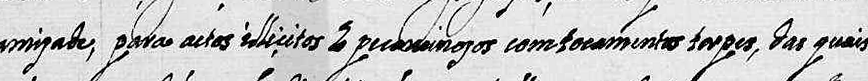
amizade, para actos illicitos E pecaminozos com tocamentos torpes, das quais
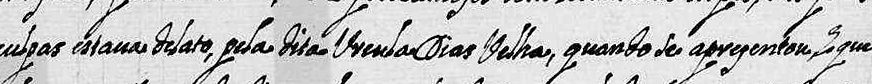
culpas estaua delato, pela dita Vrçula Dias Velha, quando se aprezentou E que
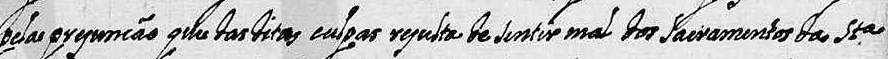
pela presunção que das ditas culpas resulta de sentir mal dos sacramentos da St.a
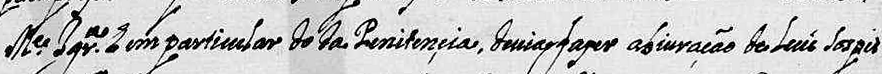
M.e Igr.a E em particular do da Penitencia, deuia faser abiuração de Leui sospei
